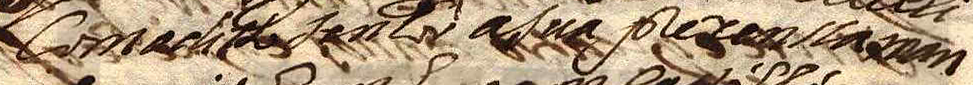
Com o ditto senhor a sua prezenssa man
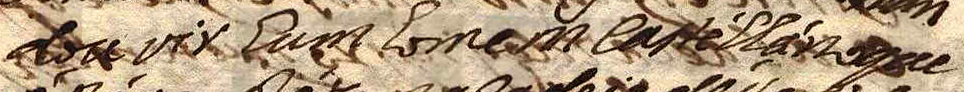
dou vir hum homem castelháno que
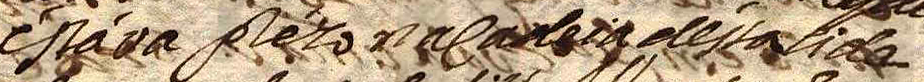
estáva prezo na Cadeia desta cida
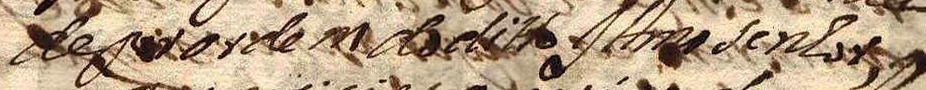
de por ordem do ditto Jllmo senhor, q
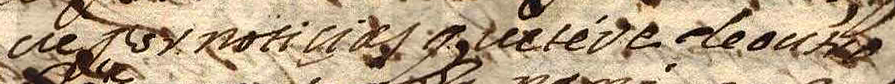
cre por noticias que téve de outro
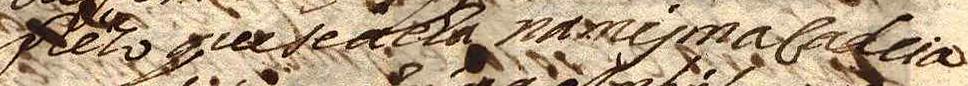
pRezo que se acha na mesma Cadeia
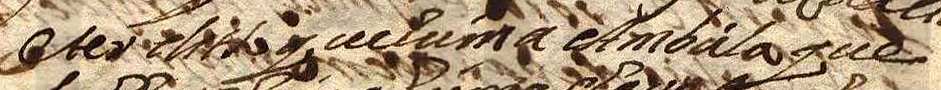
e ter ditto que huma Ambula que
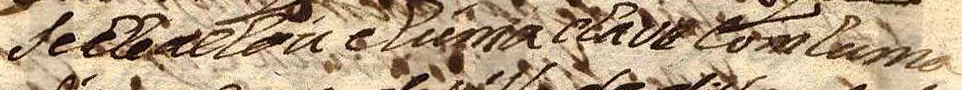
se lhe achou e huma chave com huma
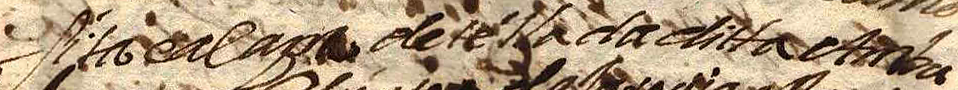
fita e acam de tella da ditta e Ambu
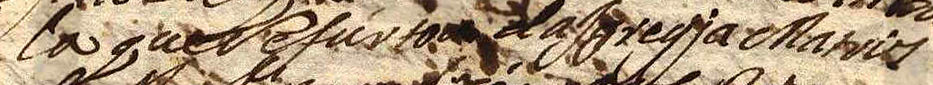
la que se furtou da Jgreyja Matris
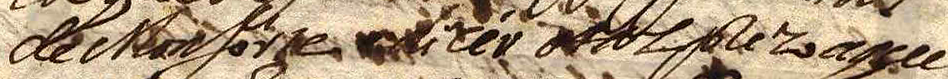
de Monforte e dizer o tal prezo a que
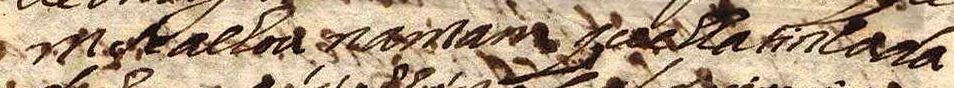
m se achou na mam que lha tinha da
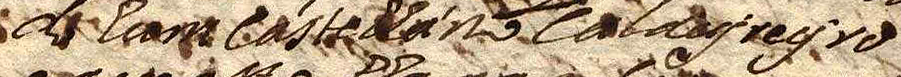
do hum castelhano Caldeyreyro
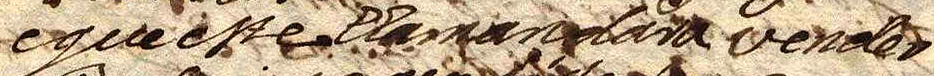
e que este lha mandara vender
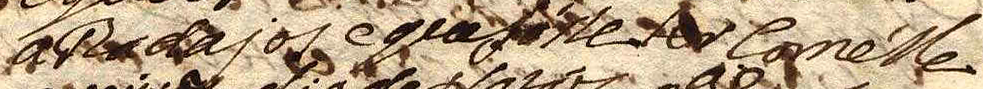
a Badajos e que fosse ter com elle
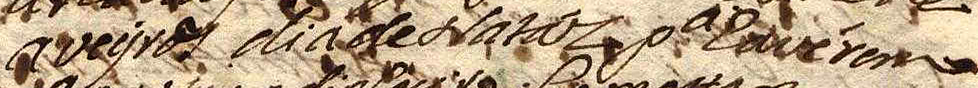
a veyros dia de NataL p.a haverem
